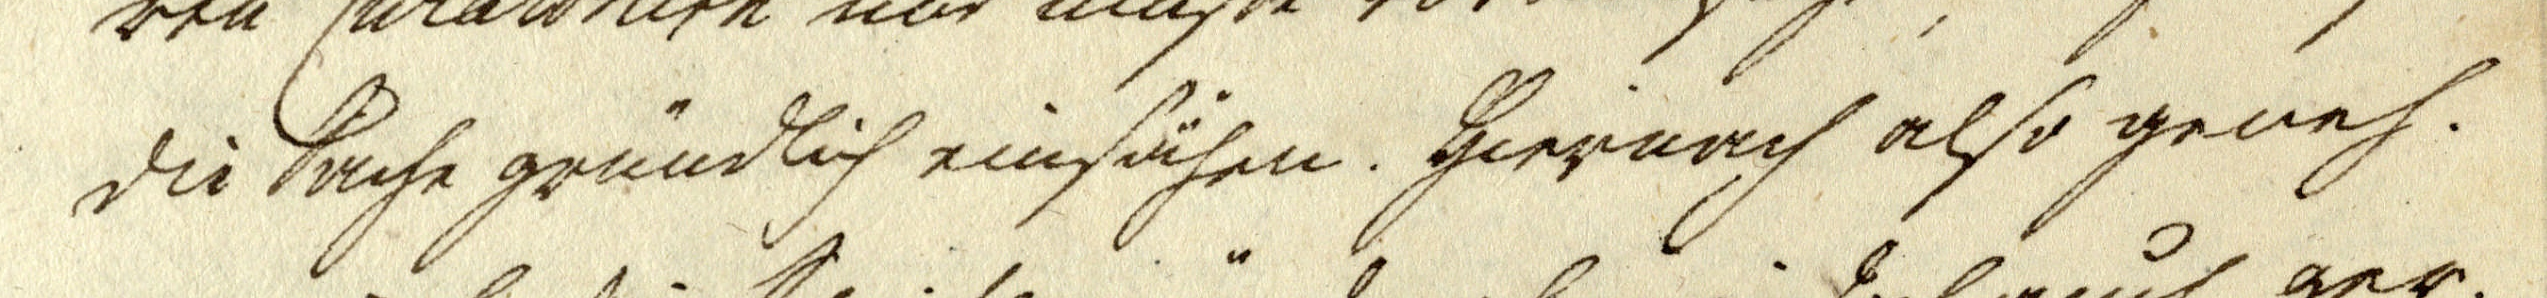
die Sache gründlich einsähen. Hiernach also geneh¬
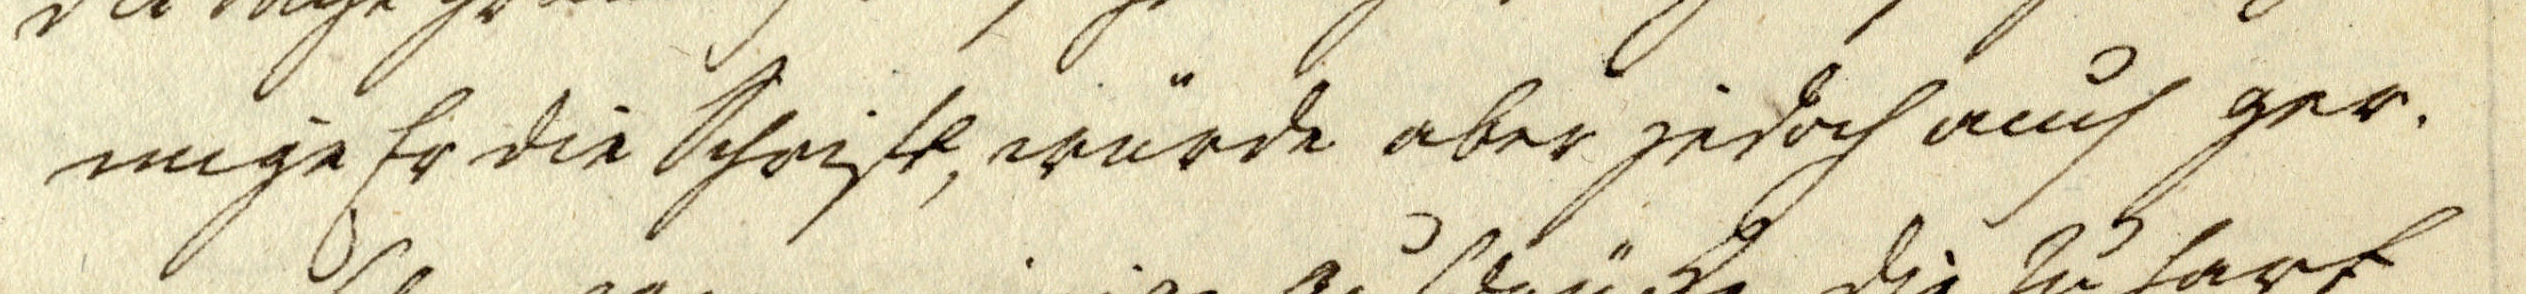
mige Er die Schrift, würde aber jedoch auch ger¬
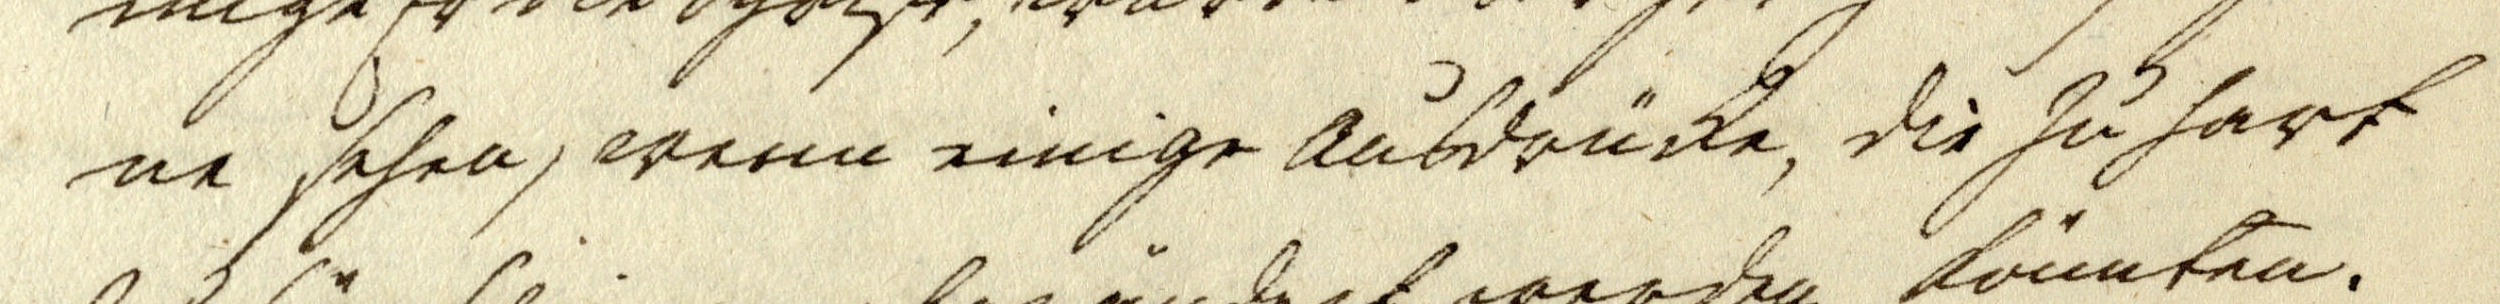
ne sehen, wenn einige Ausdrücke, die zu hart
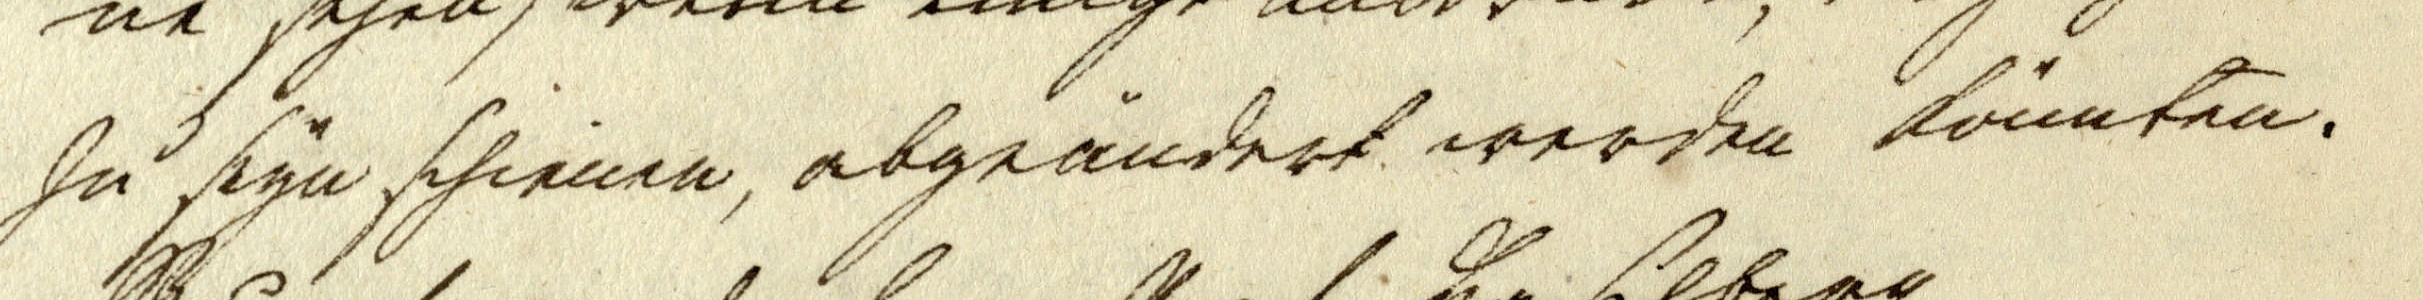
zu seÿn schienen, abgeändert werden könnten.
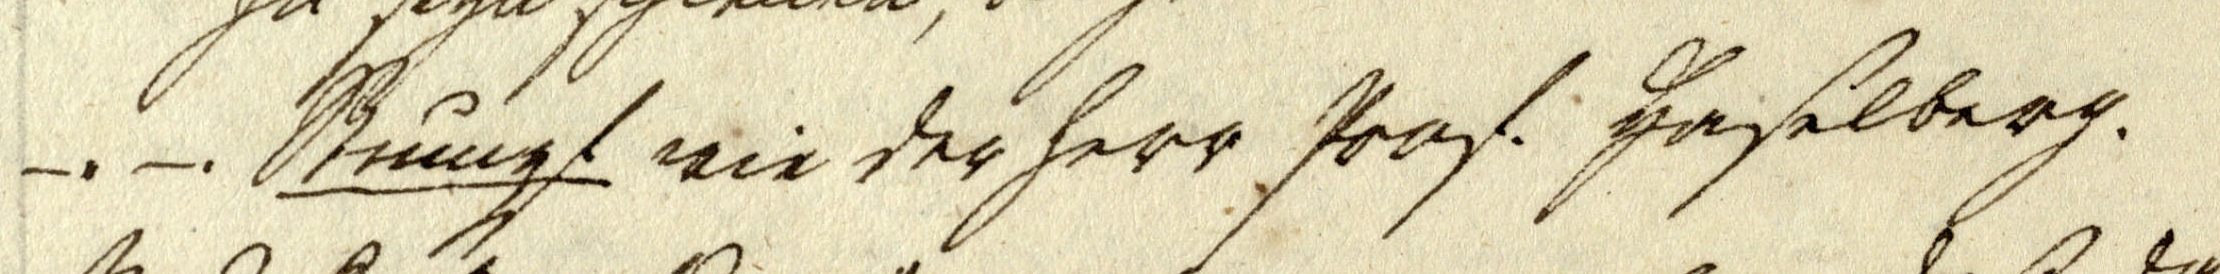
Stumpf wie der Herr Prof. Haselberg.
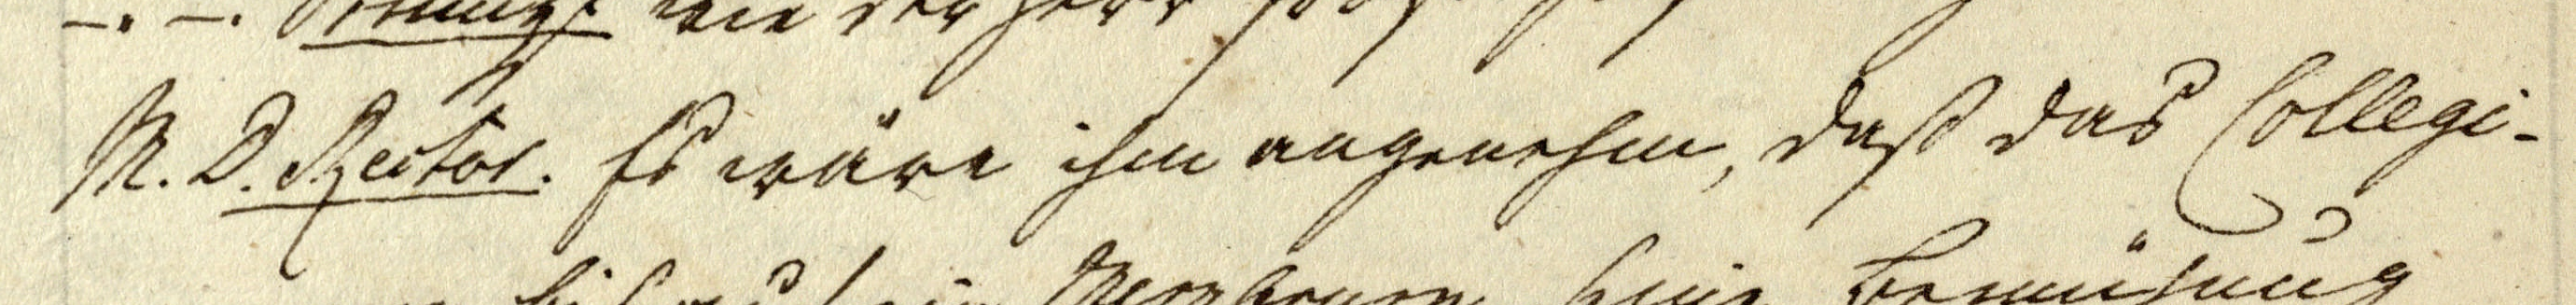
M. D. Rector. Es wäre ihm angenehm, daß das Collegi¬
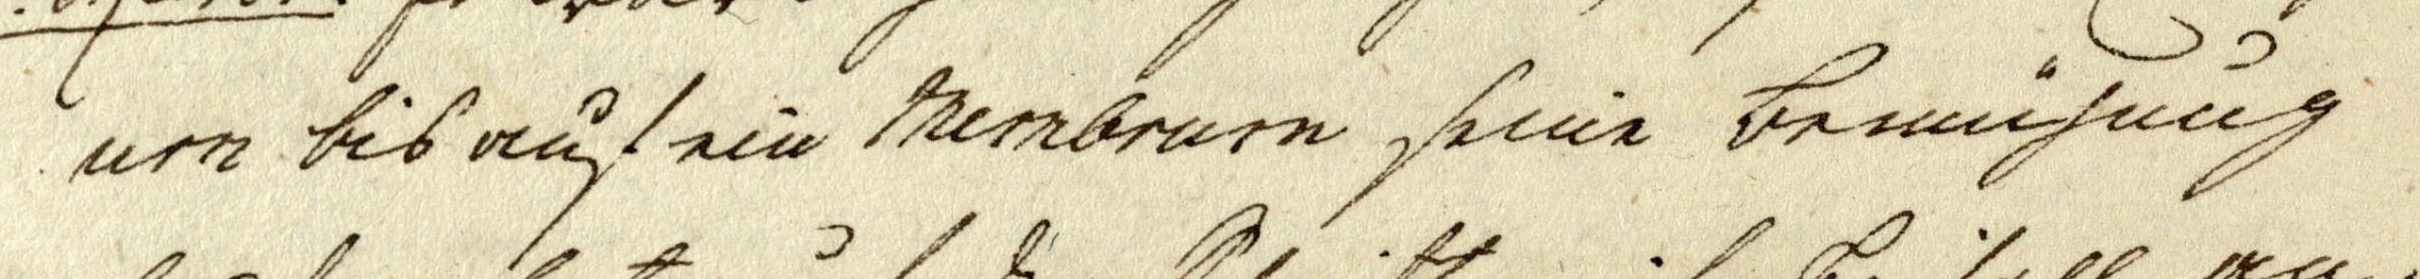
um bis auf ein Membrum seine Bemühung
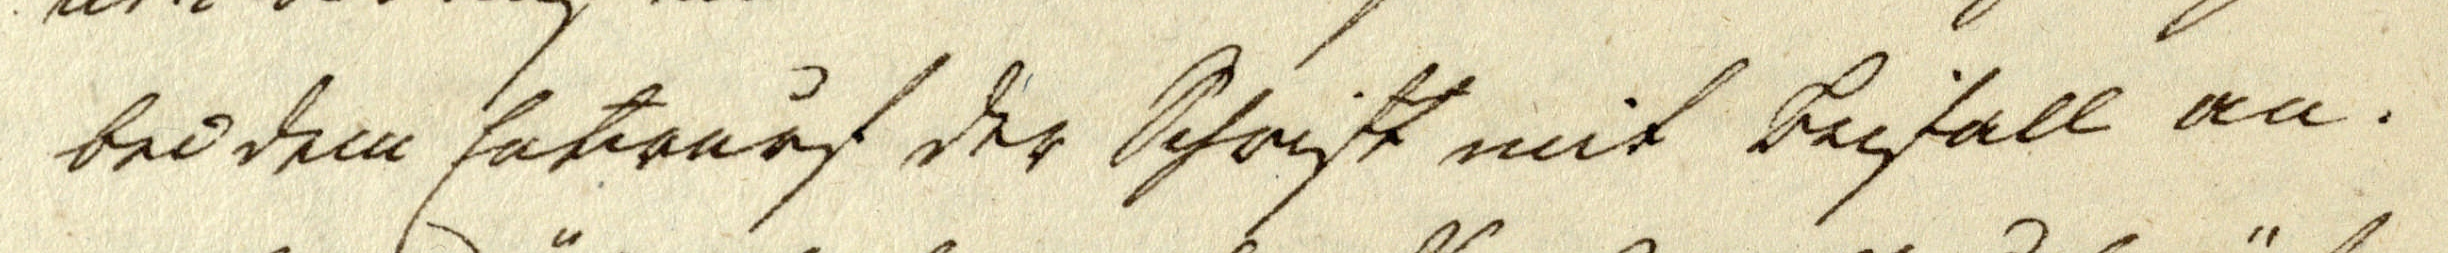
bei dem Entwurf der Schrift mit Beifall an¬
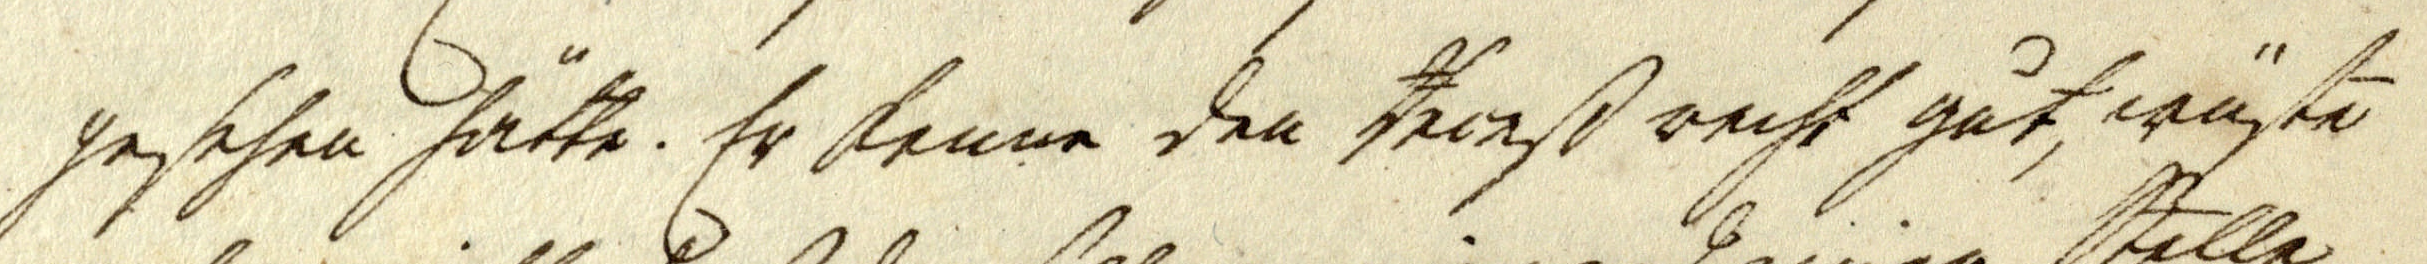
gesehen hätte. Er kenne den Receß recht gut, wüßte
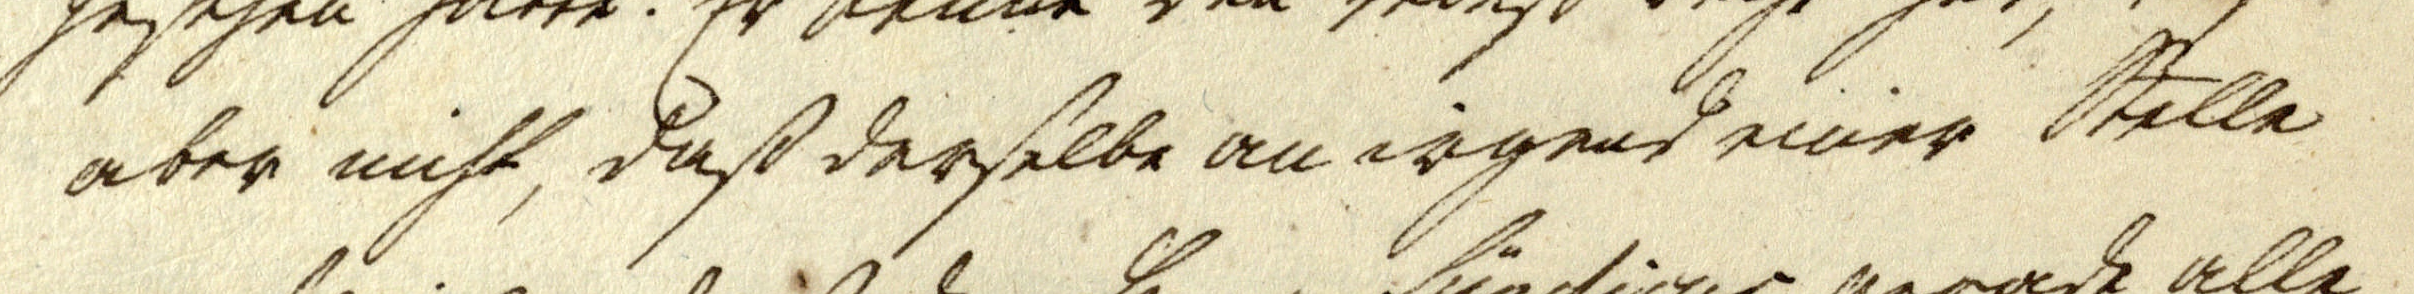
aber nicht, daß derselbe an irgend einer Stelle
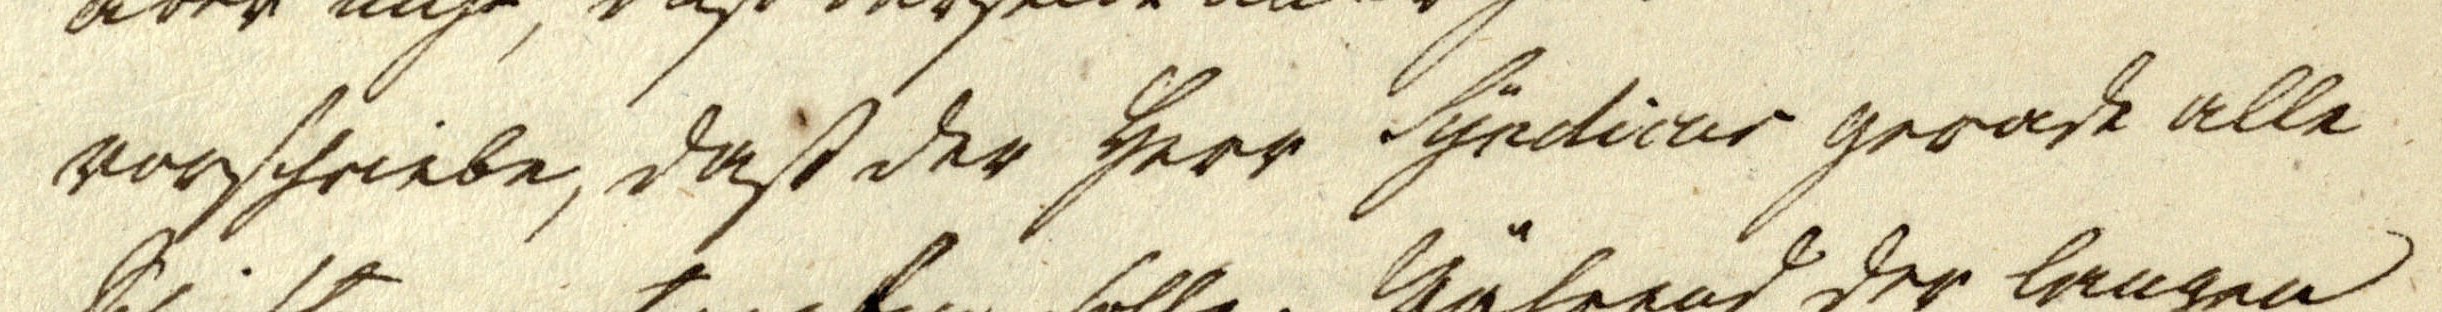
vorschriebe, daß der Herr Sÿndicus gerade alle
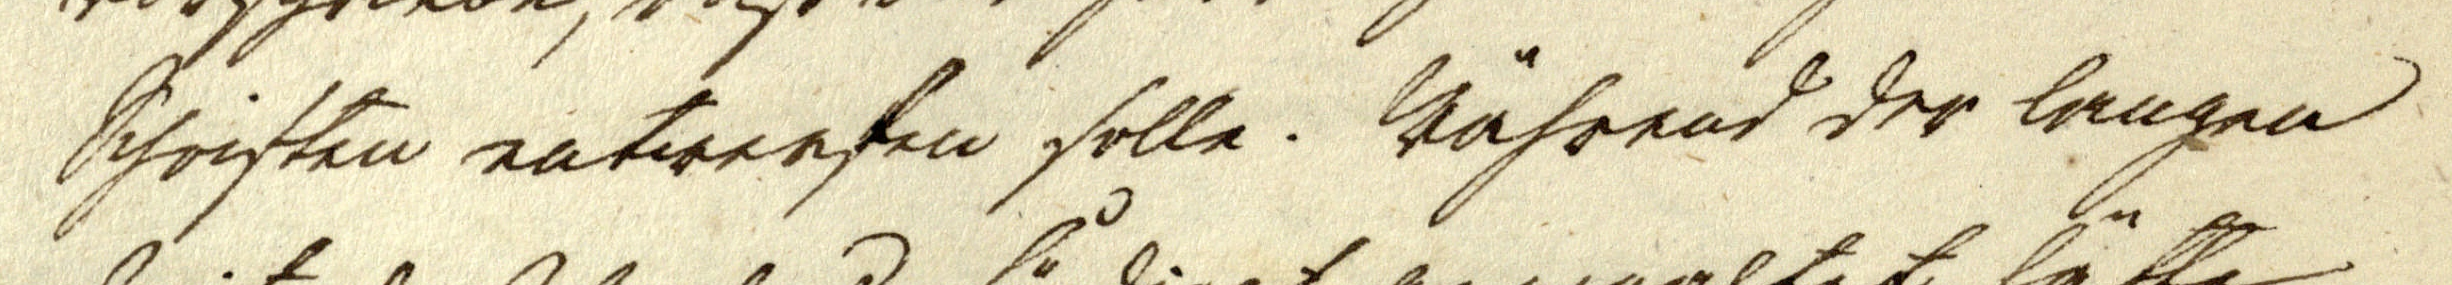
Schriften entwerfen solle. Wahrend der langen
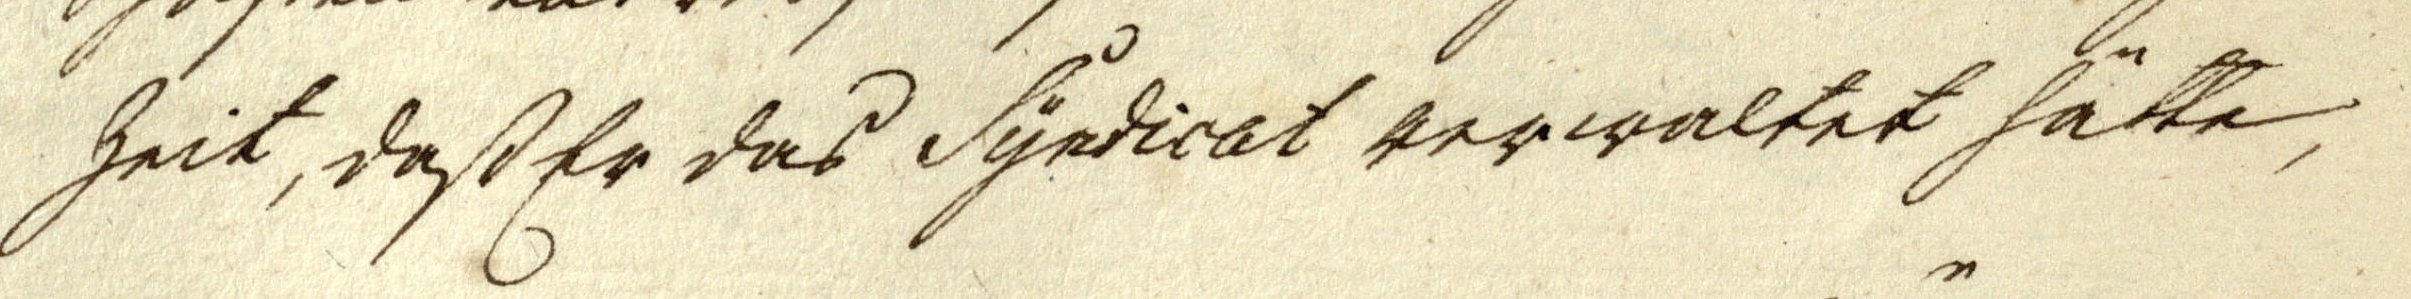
Zeit, daß Er das Sÿndicat verwaltet hätte,
